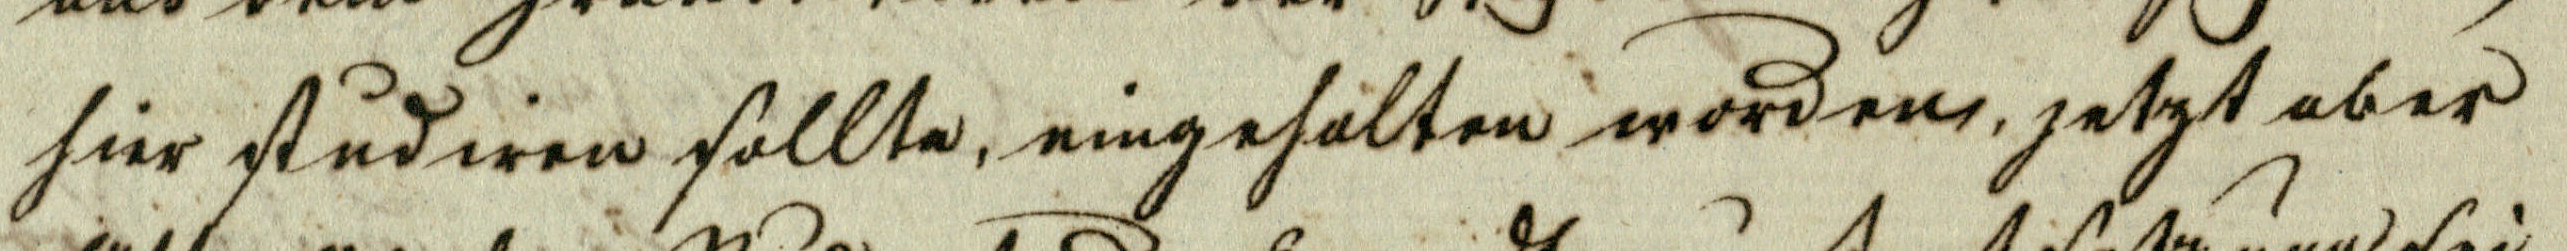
hier studiren sollte, eingehalten worden, jetzt aber
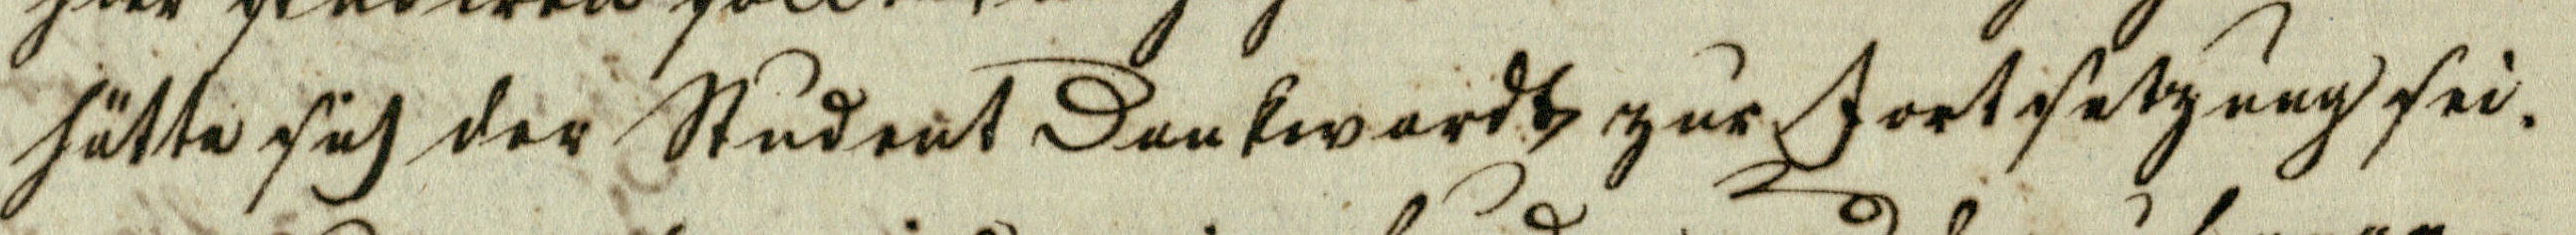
hätte sich der Student Dankwardt zur Fortsetzung sei¬
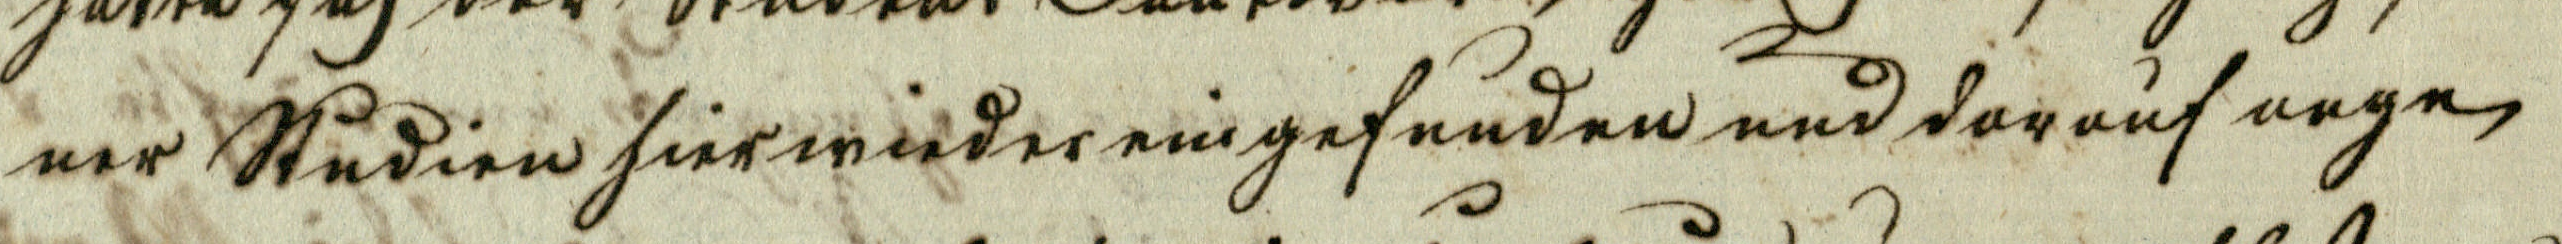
ner Studien hier wieder eingefunden und darauf ange¬
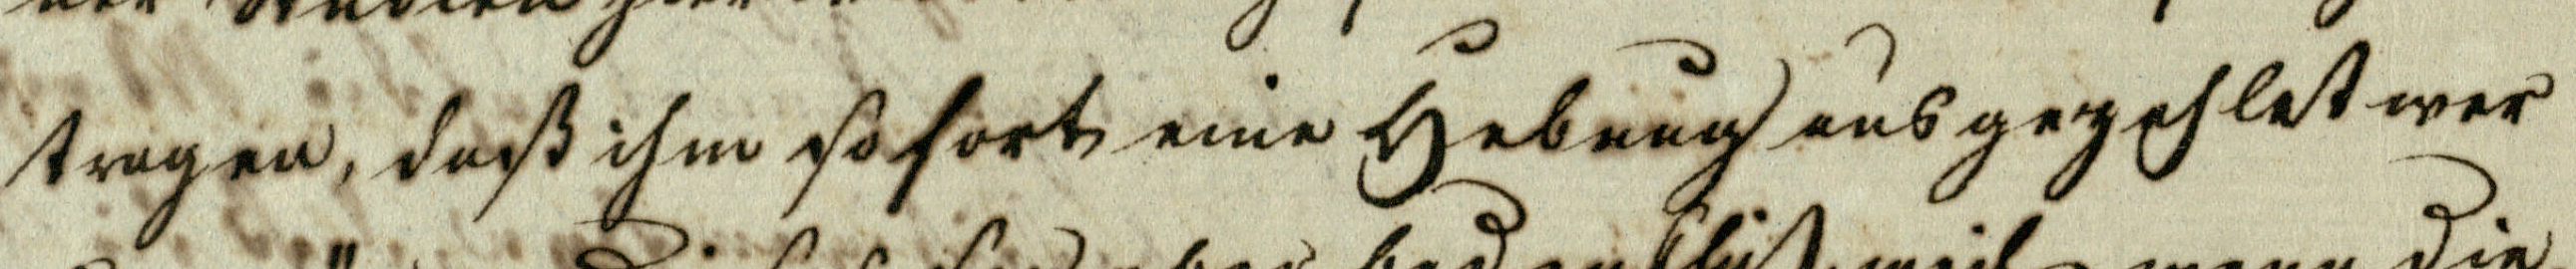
tragen, daß ihm sofort eine Hebung ausgezahlet wer¬
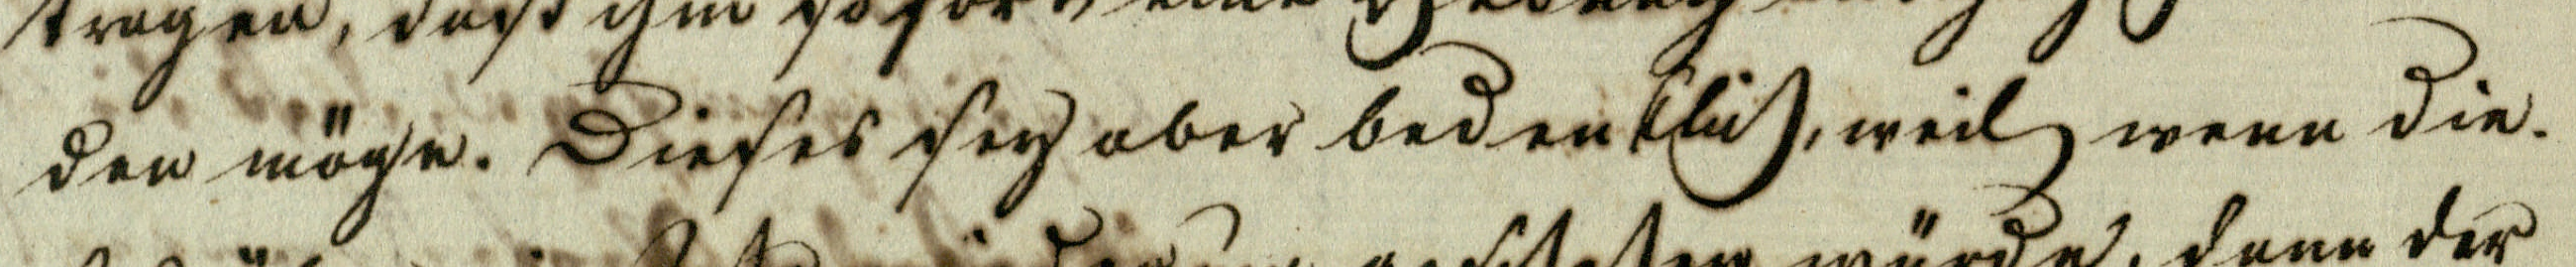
den möge. Dieses sey aber bedenklich, weil wenn die¬
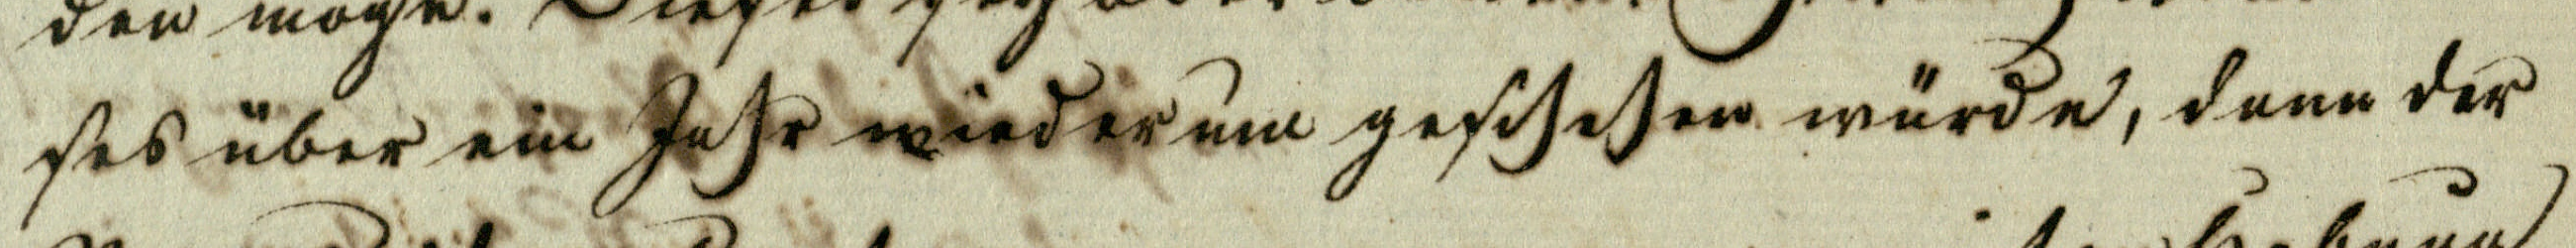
ses über ein Jahr wiederum geschehen würde, dann der
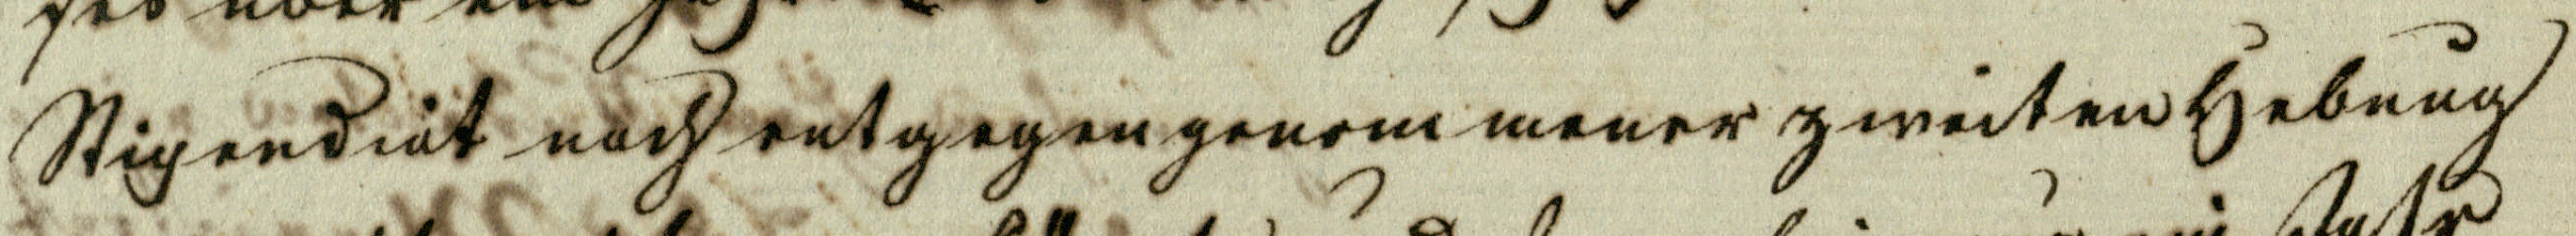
Stipendiat nach entgegengenommener zweiten Hebung
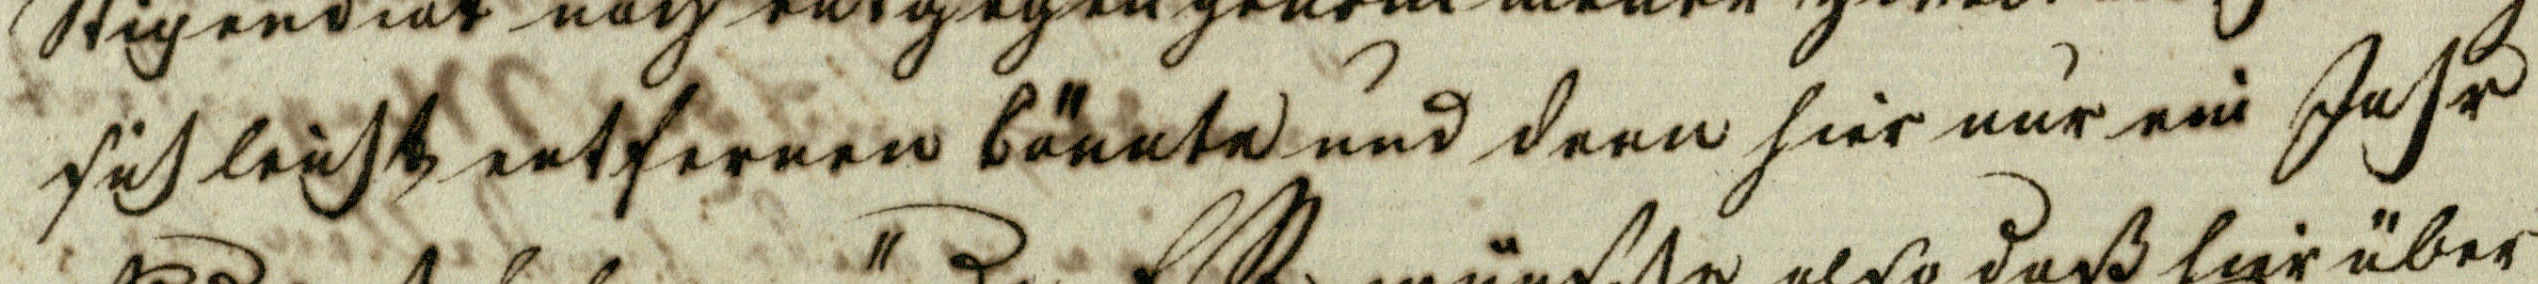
sich leicht entfernen könnte und denn hier nur ein Jahr
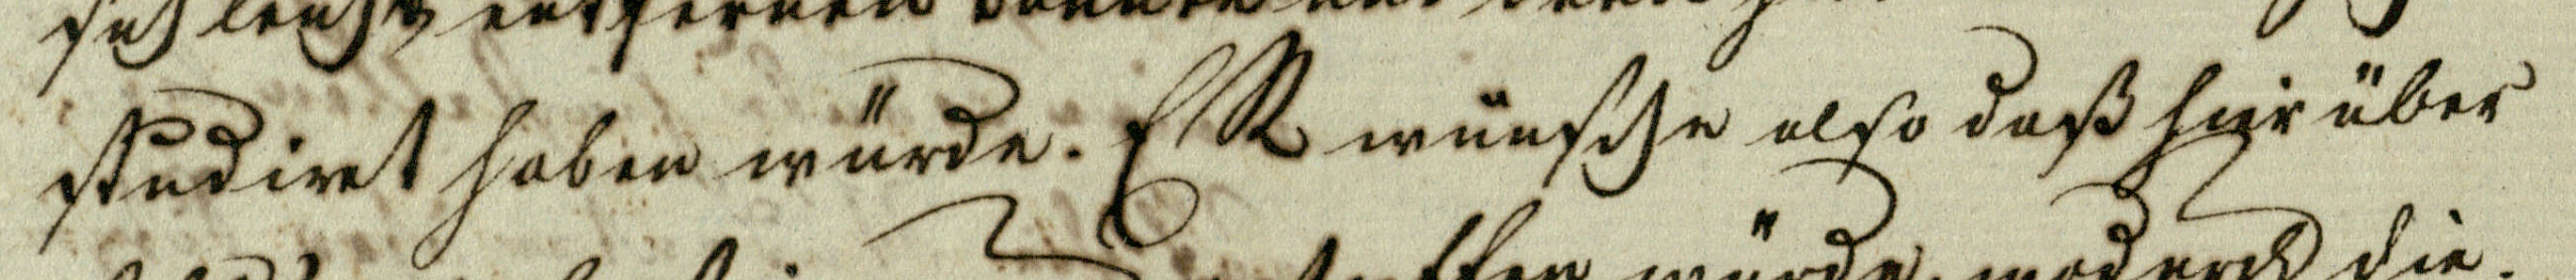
studiret haben würde. Er wünsche also daß hierüber
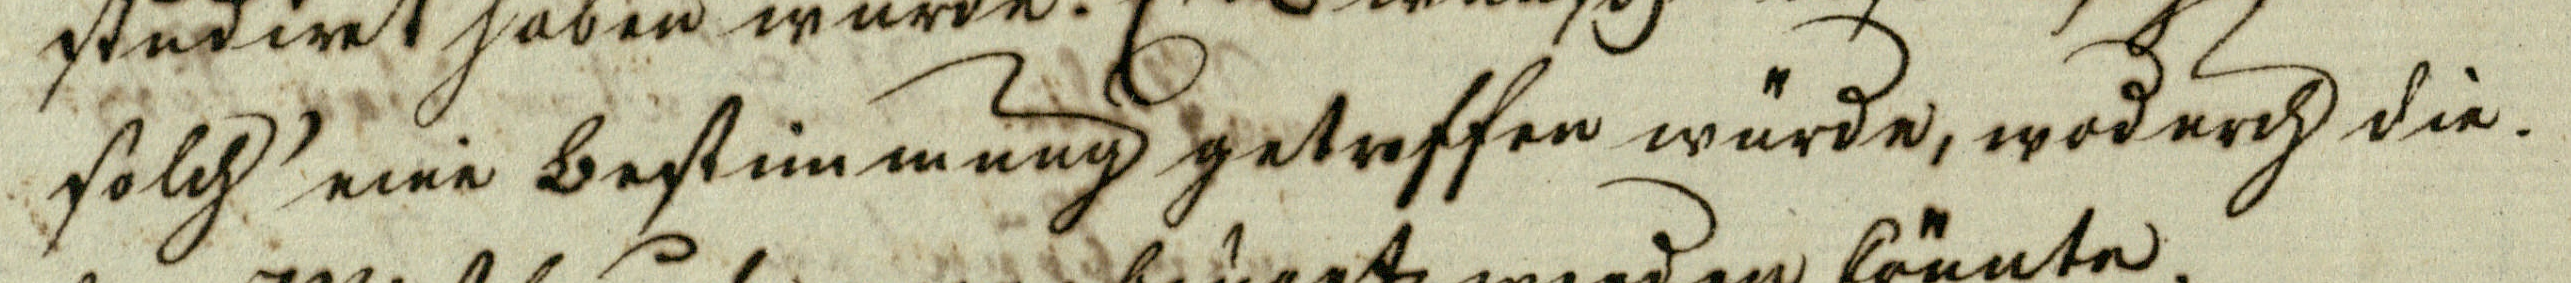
solch' eine Bestimmung getroffen würde, wodurch die¬
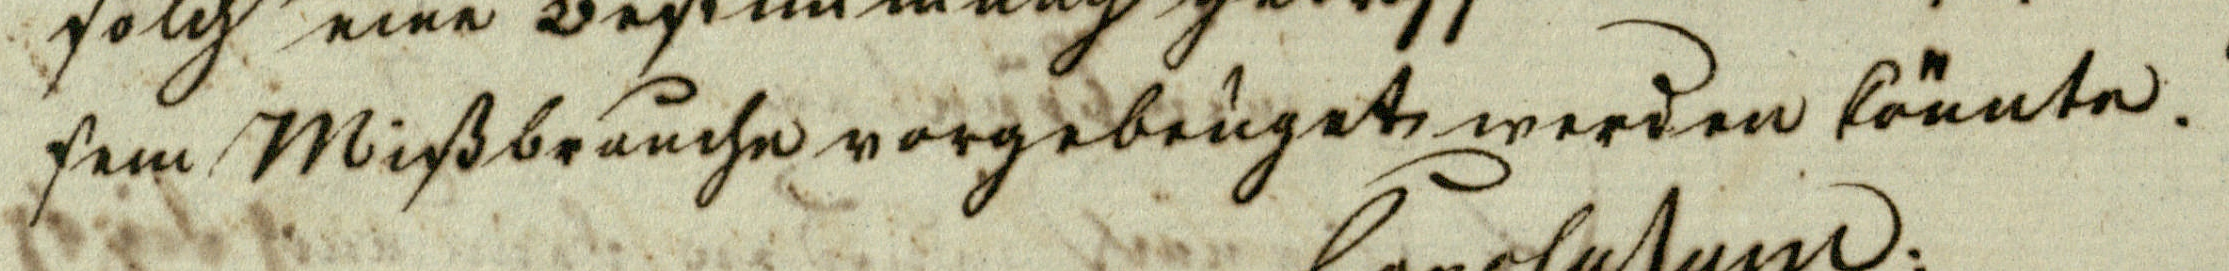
sem Mißbrauche vorgebeuget werden könnte.
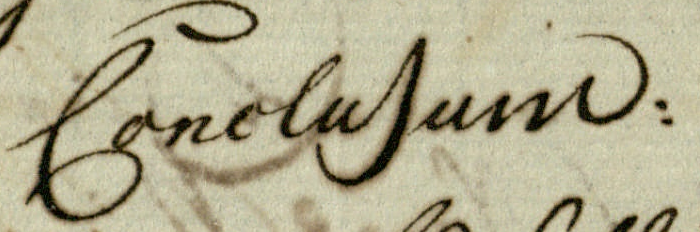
Conclusum:
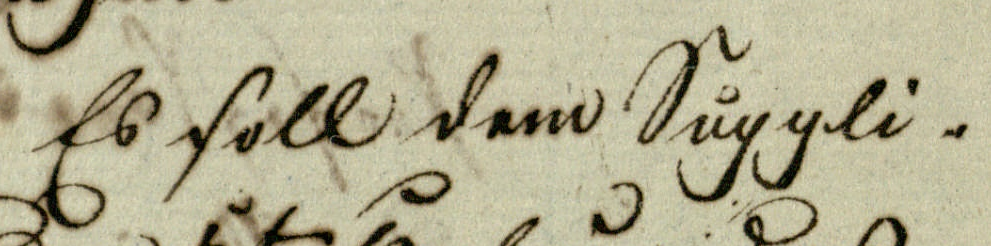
Es soll dem Suppli¬
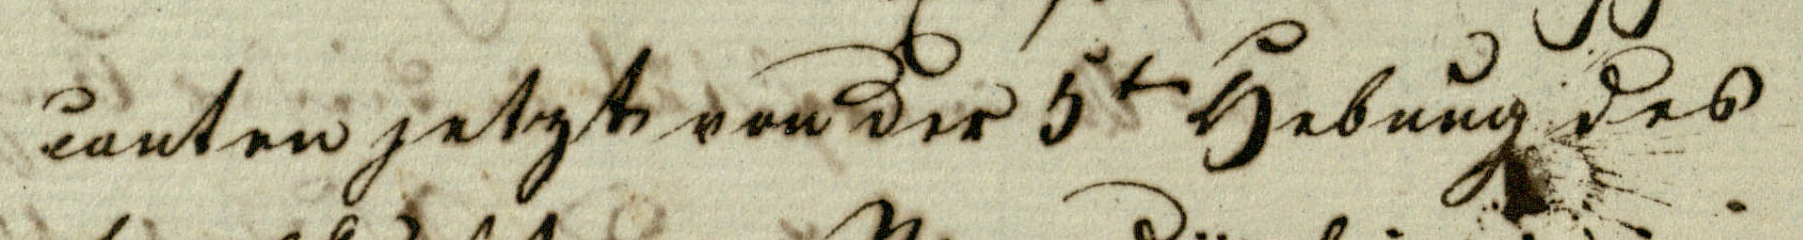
canten jetzt von der 5 ten Hebung des
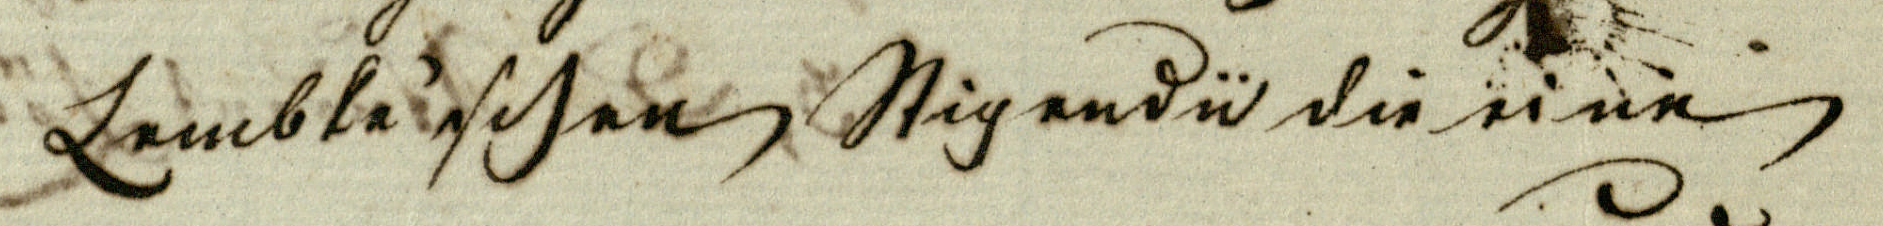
Lembke'schen Stipendii die eine
